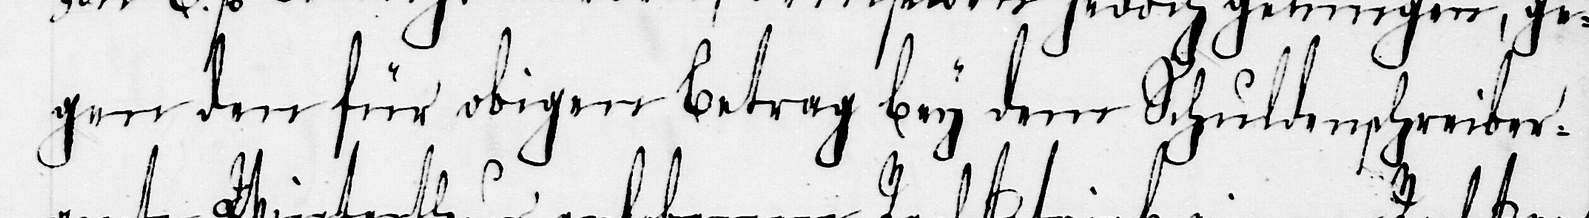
gen den für obigen Betrag bey dem Schuldenschreiber¬
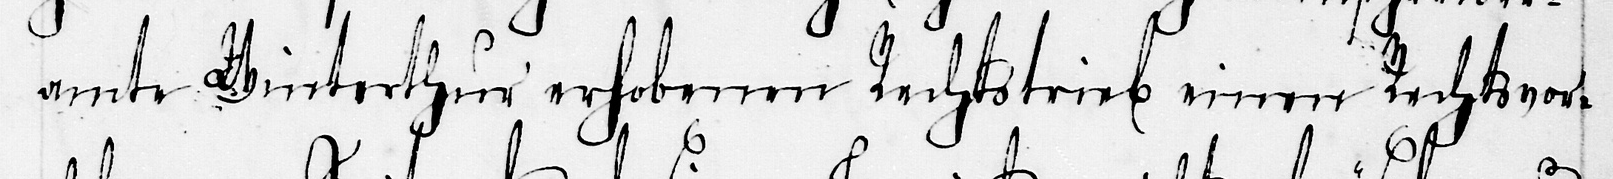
amte Winterthur erhobenen Rechtstrieb einen Rechtsvor¬
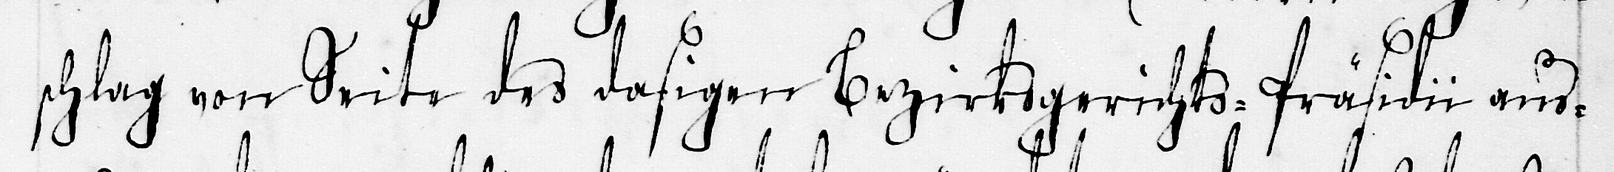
schlag von Seite des dasigen Bezirksgerichts-Präsidii aus¬
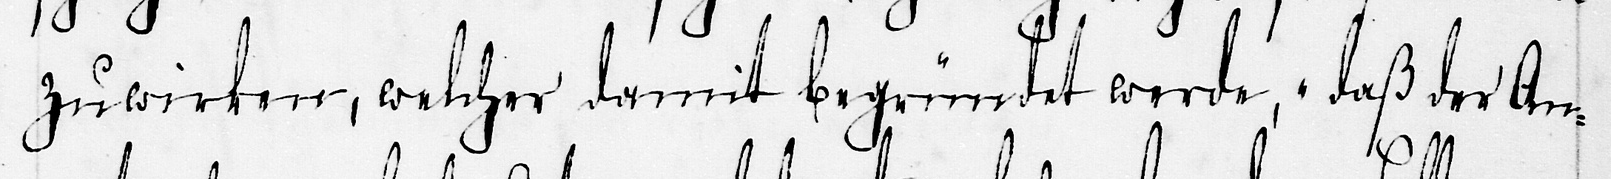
zuwirken, welcher damit begründet werde, „daß der An¬
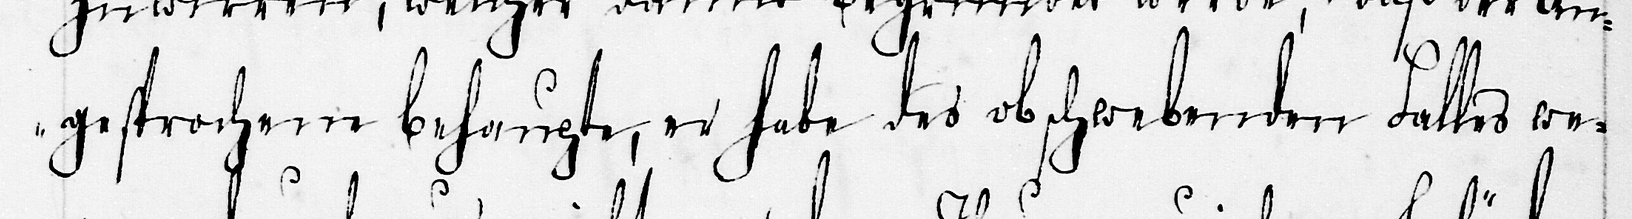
gesprochene behaupte, er habe des obschwebenden Falles we¬
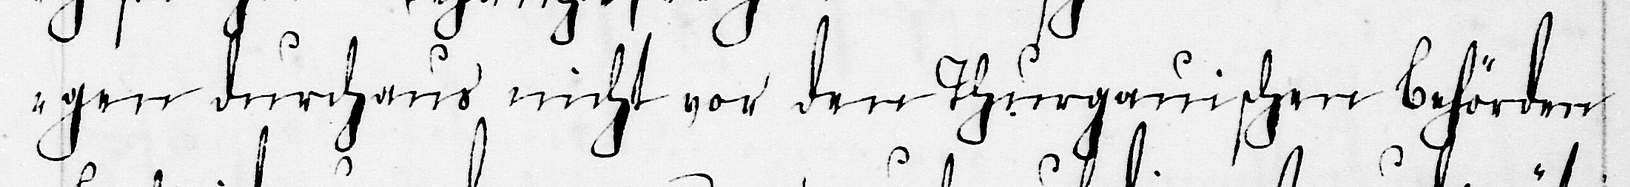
gen durchaus nicht vor den Thurgauischen Behörden
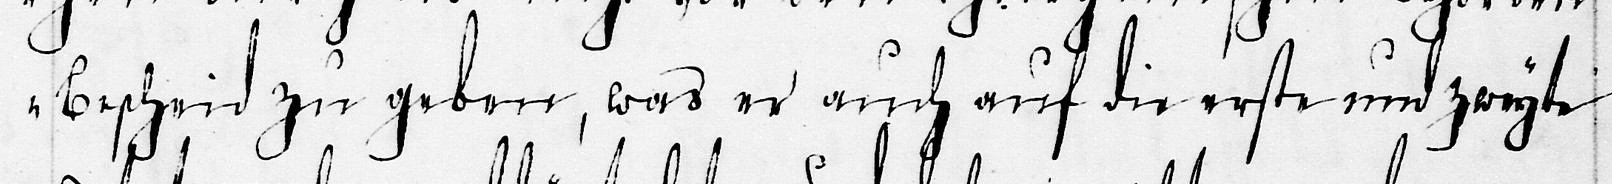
Bescheid zu geben, was er auch auf die erste und zweyte
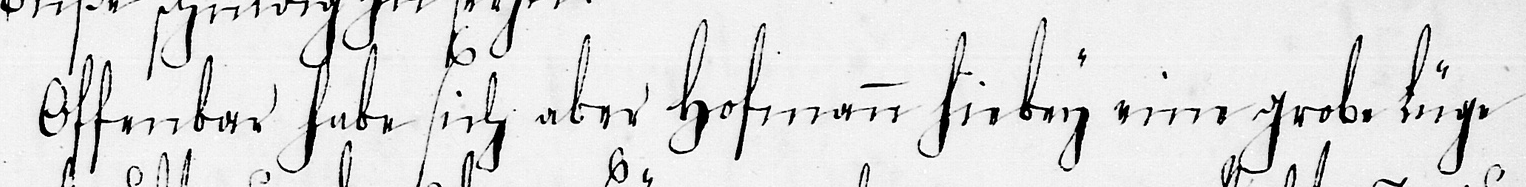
Offenbar habe sich aber Hofmann hiebey eine grobe Lüge
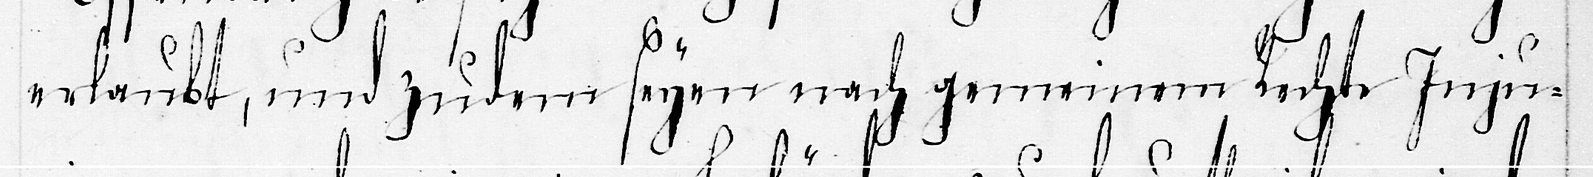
erlaubt, und zudem seyen nach gemeinem Rechte Inju¬
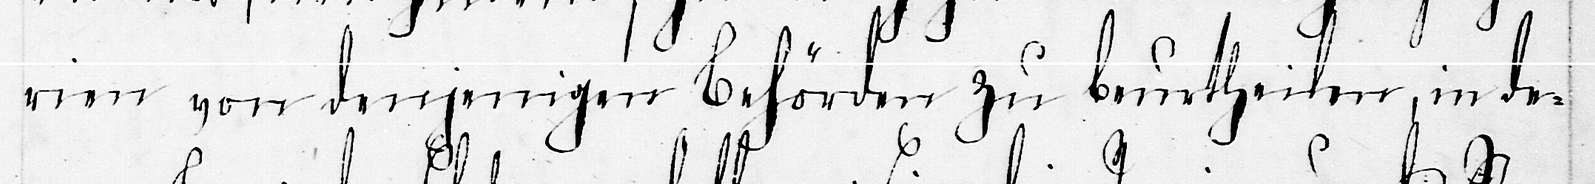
rien von denjenigen Behörden zu beurtheilen, in de¬
